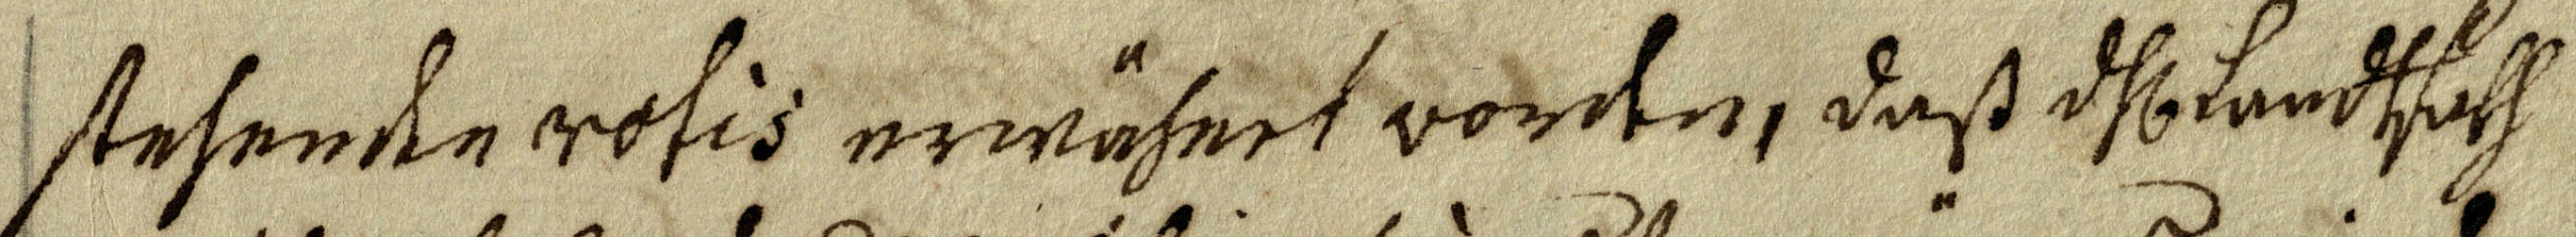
stehenden votis erwähnet worden, daß dh LandRath
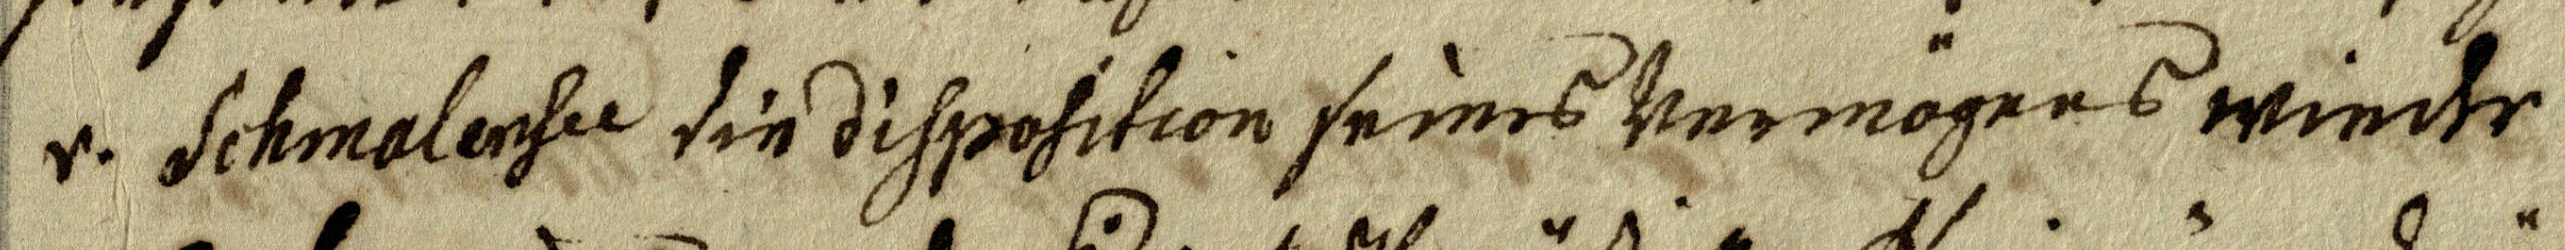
v. Schmalensee die disposotion seines Vermögens wieder
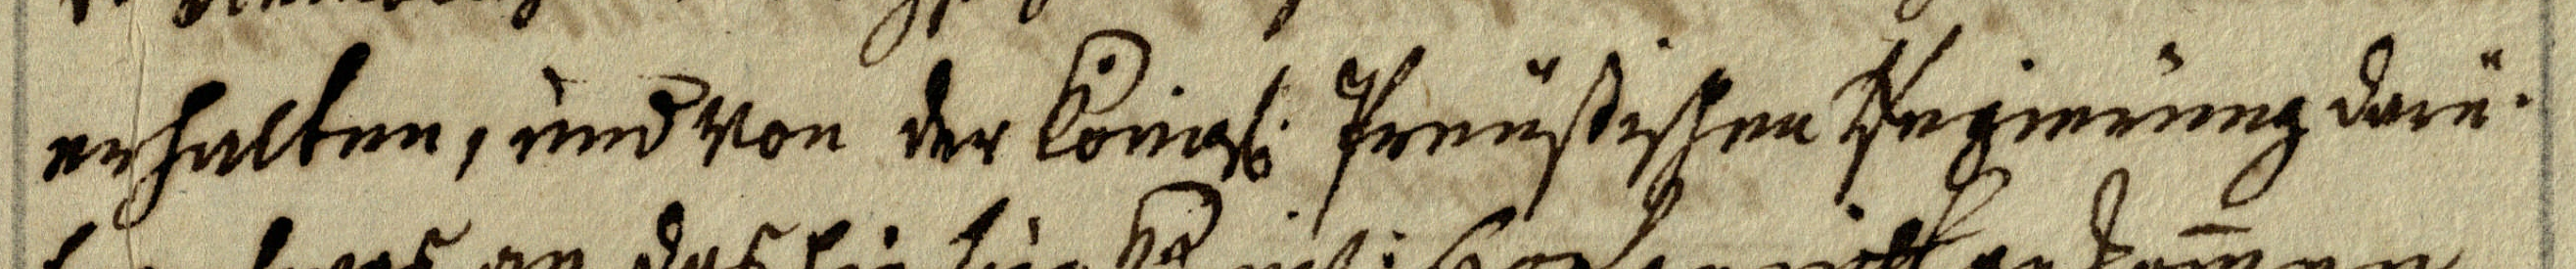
erhalten, und von der Königl. Preußischen Regierung darü¬
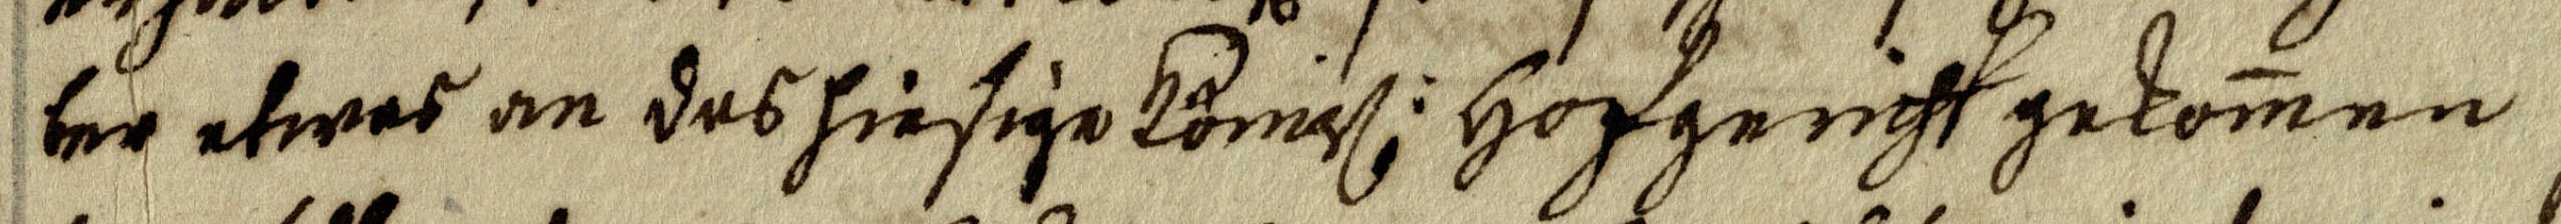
ber etwas an das hiesige Königl. Hofgericht gekomen
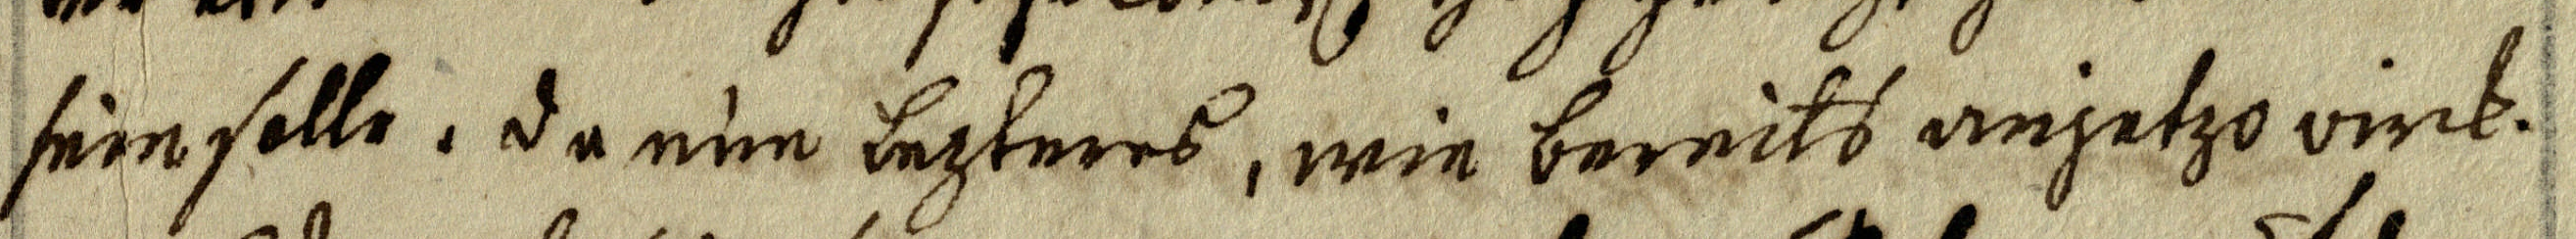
sein solle. Da nun Lezteres, wie bereits anjetzo wirk¬
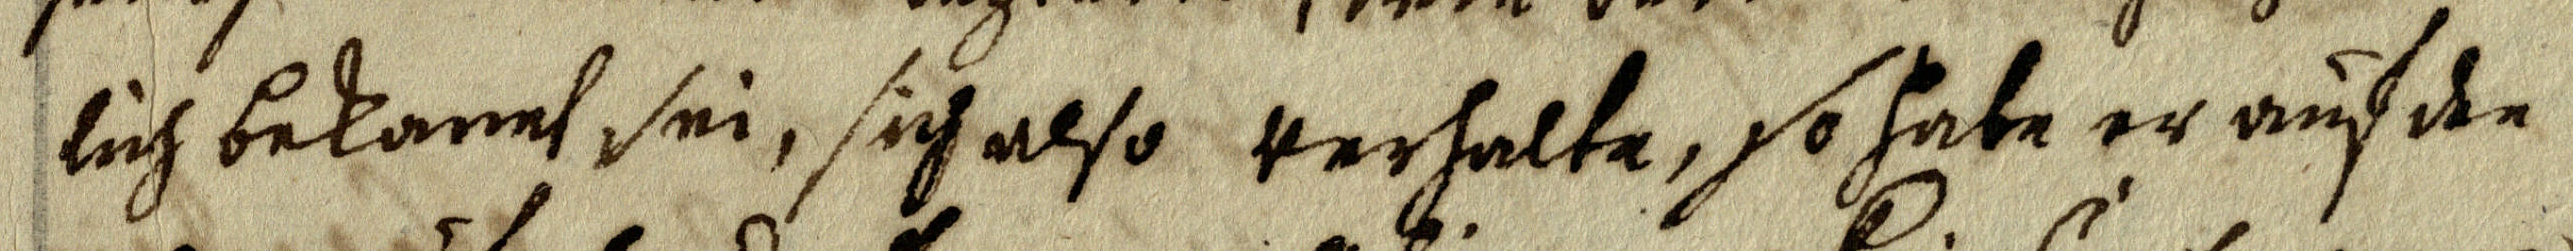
lich bekannt sei, sich also verhalte, so habe er auf den
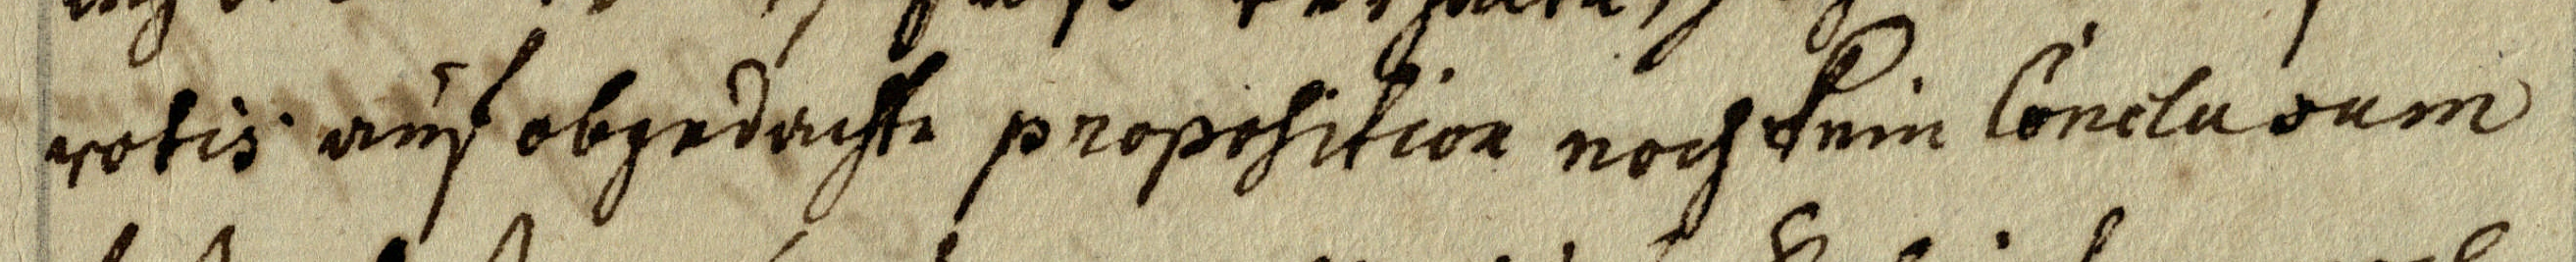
votis auf obgedachte proposition noch kein Conclusum
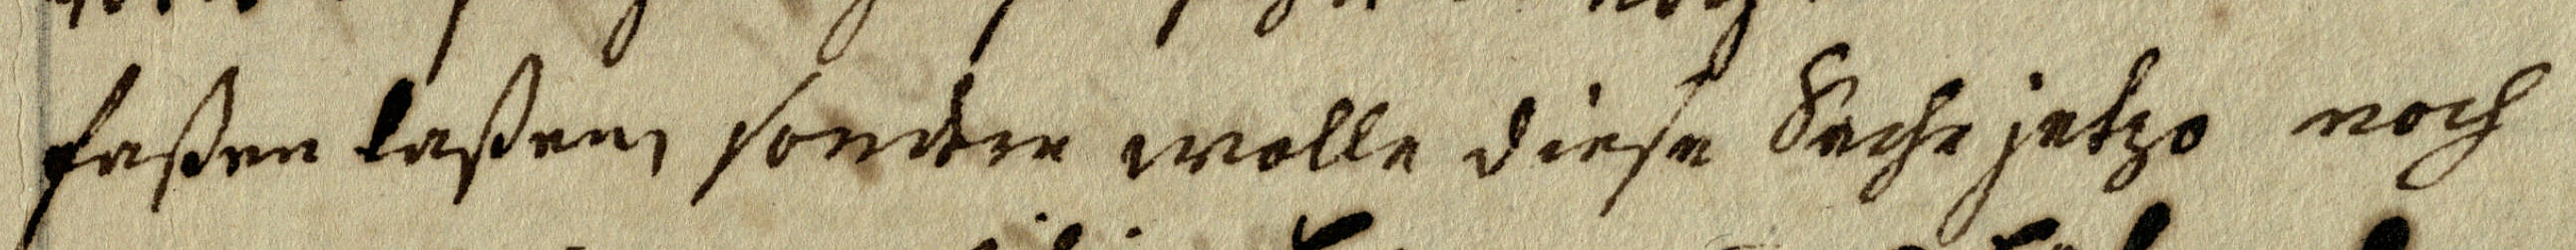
faßen laßen, sondern wolle diese Sache jetzo noch
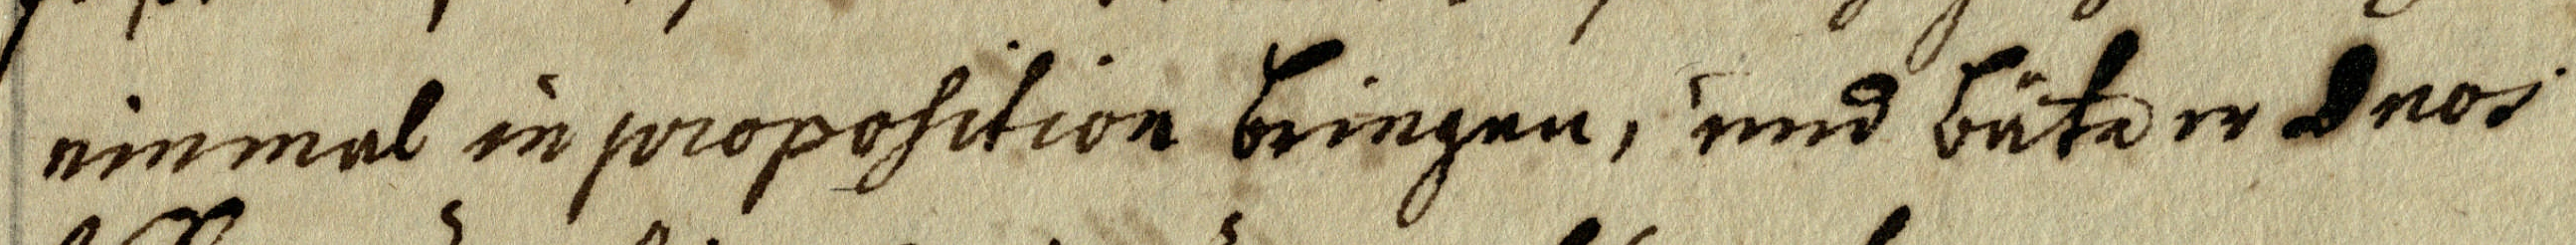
einmal in proposition bringen, und bäte er D nos
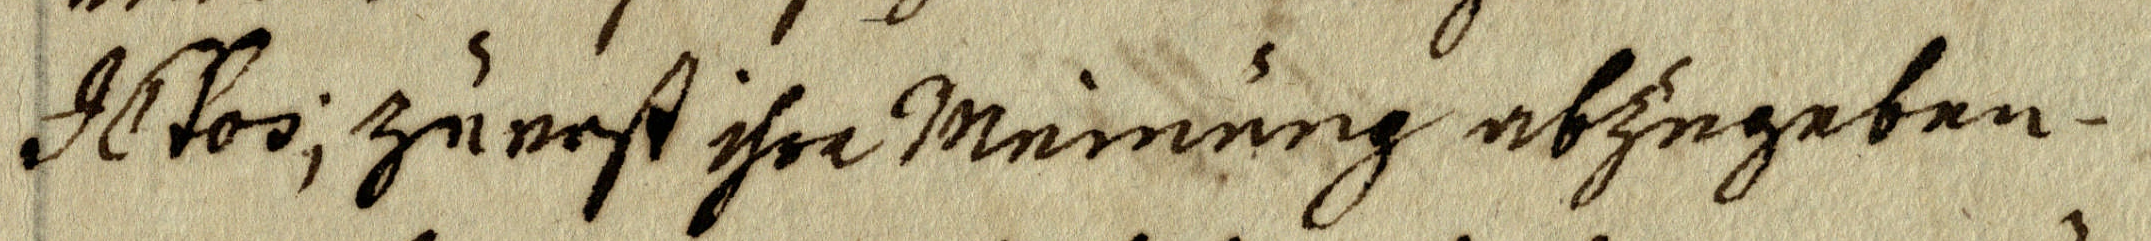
IC tos; zuerst ihre Meinung abzugeben.
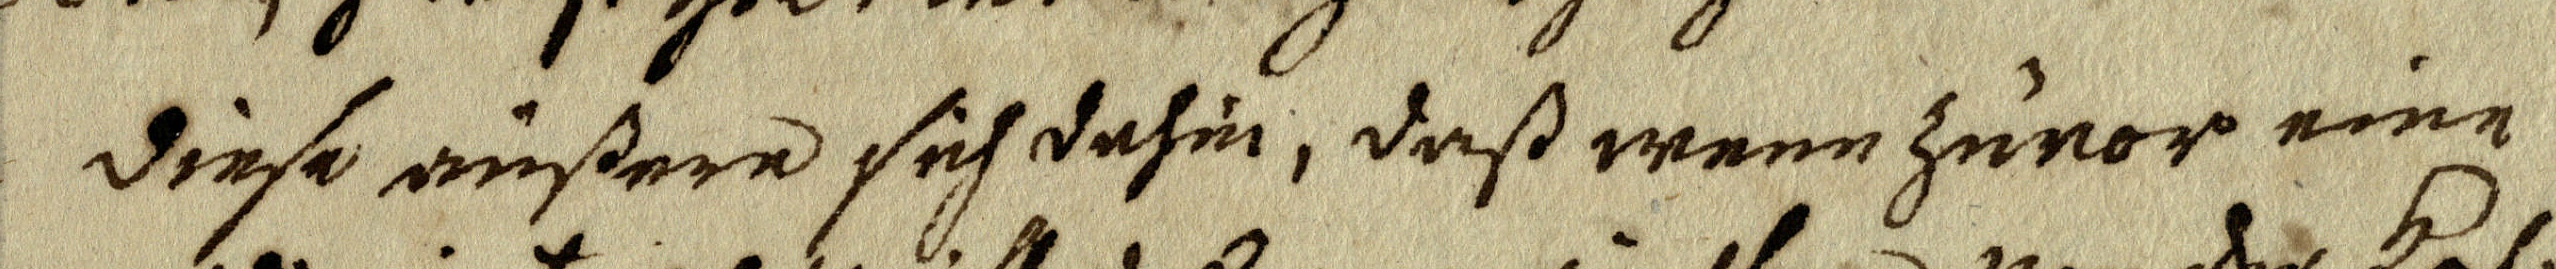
Diese äußern sich dahin, daß wenn zuvor eine
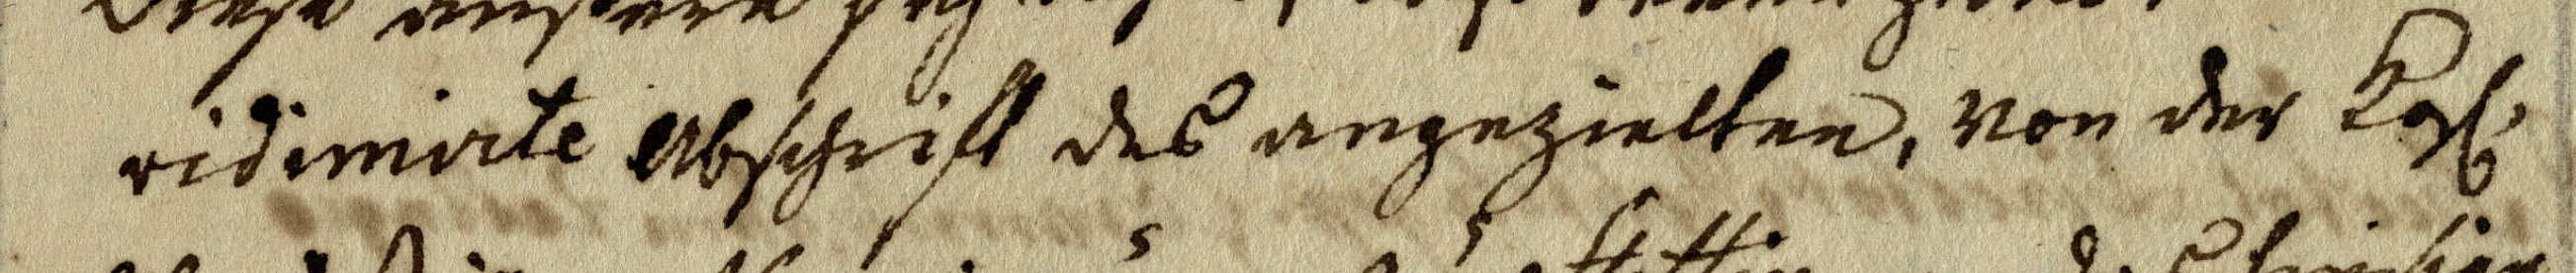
vidimirte Abschrift des angezielten, von der Kgl.
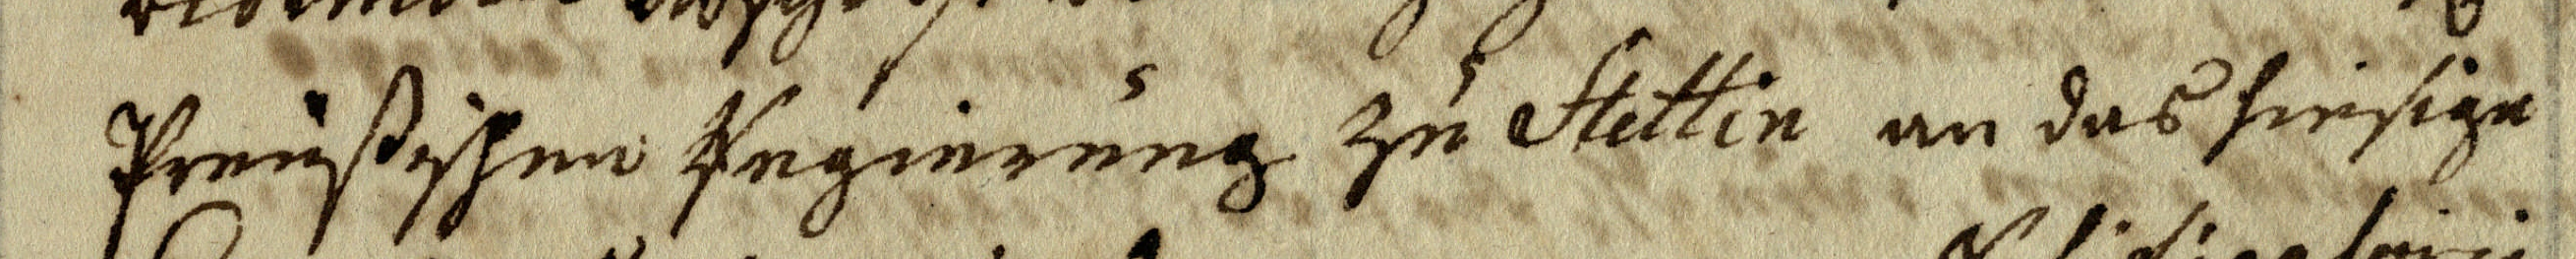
Preußischen Regierung zu Stettin an das hiesige
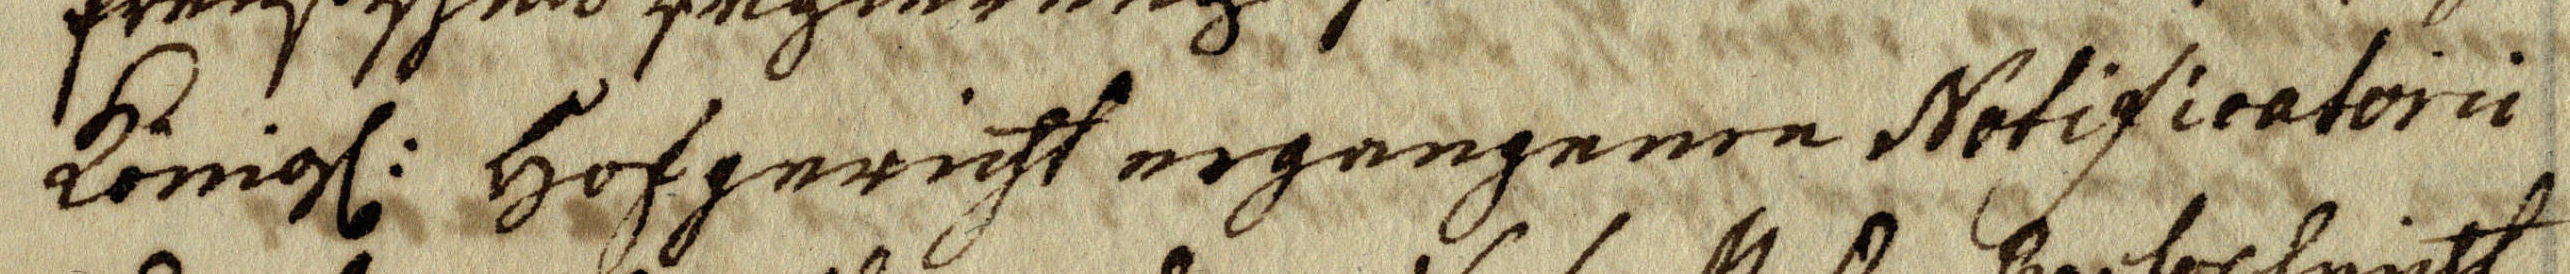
Königl. Hofgericht ergangenen Notificatorii
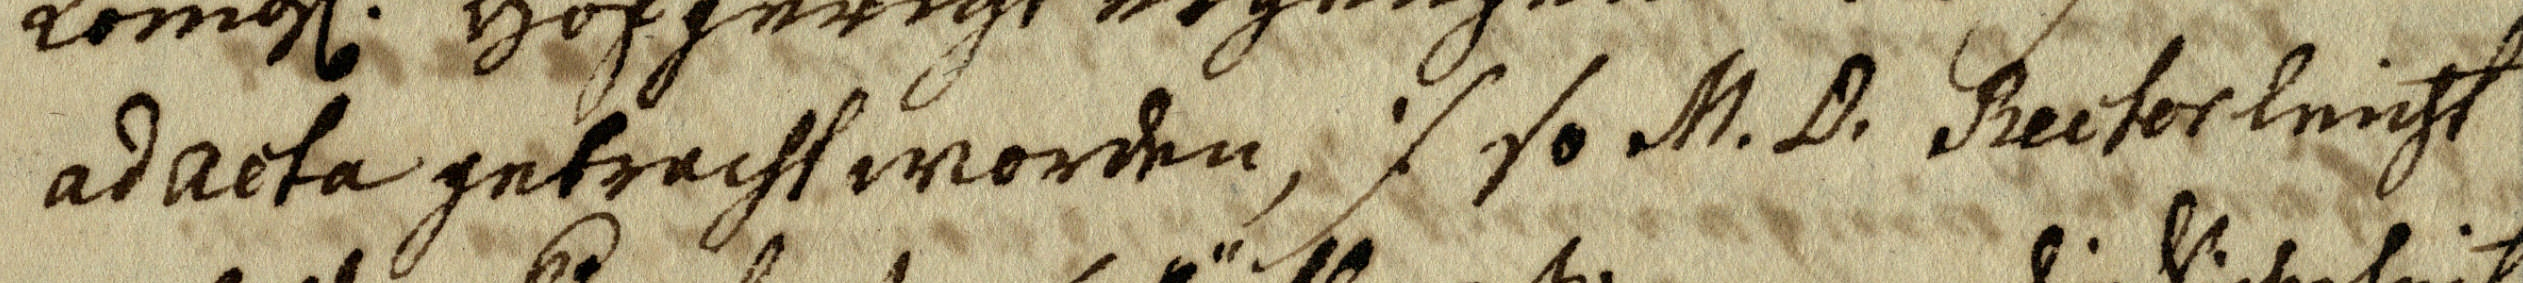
ad acta gebracht worden, ./. so M. D. Rector leicht
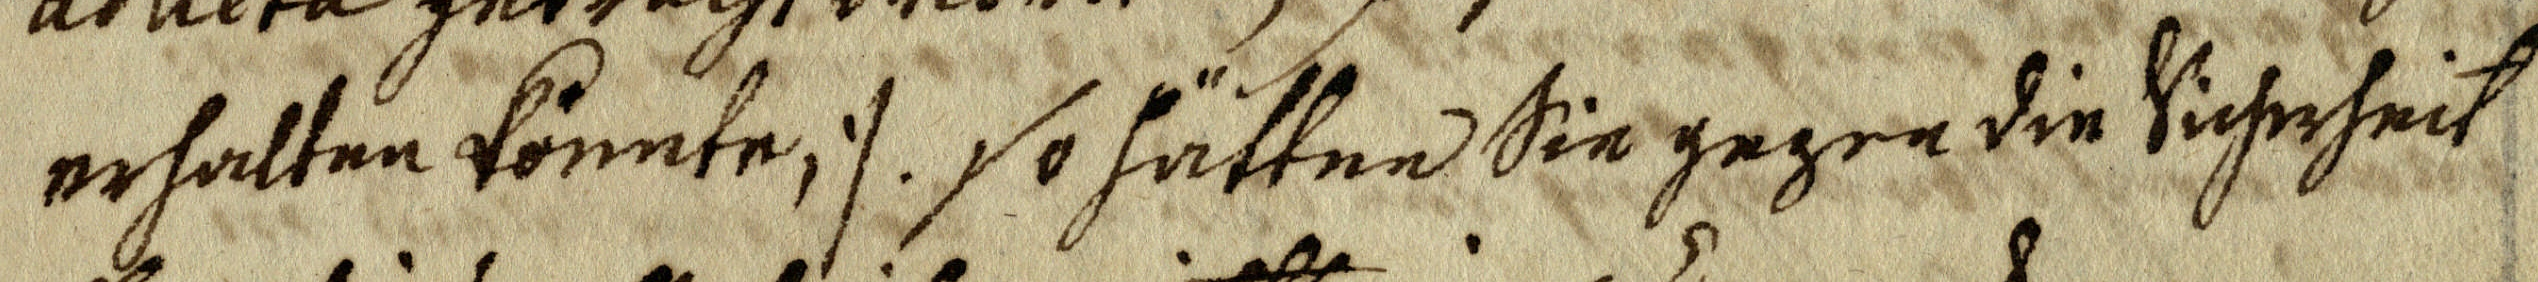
erhalten könnte, ./. so hätten Sie gegen die Sicherheit
